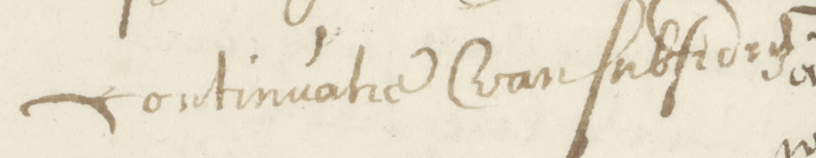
continuatie van subsidien
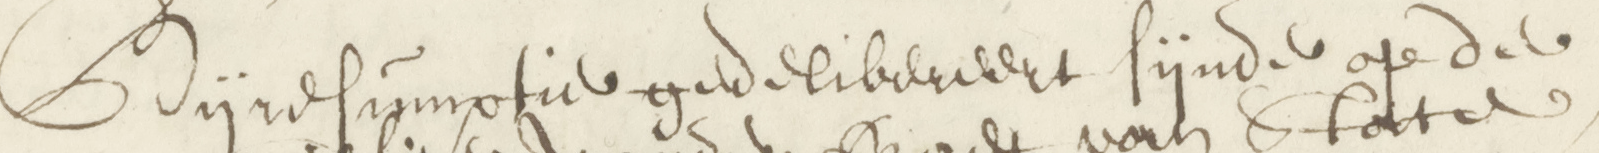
Bij resumptie gedelibereert sijnde op de
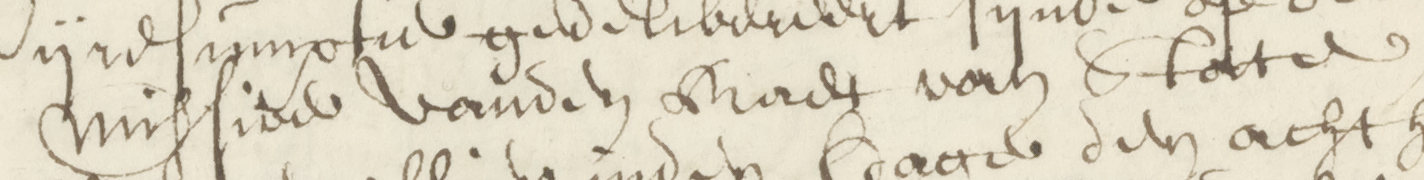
Missive vanden Raet van State,
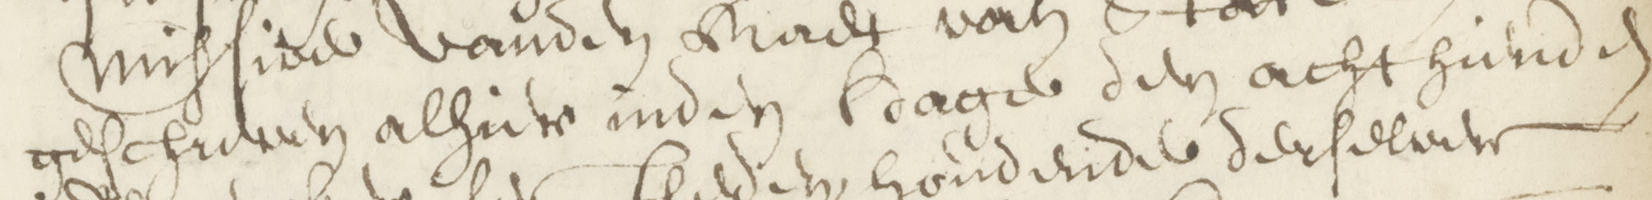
geschreven alhier inden Hage den achthienden
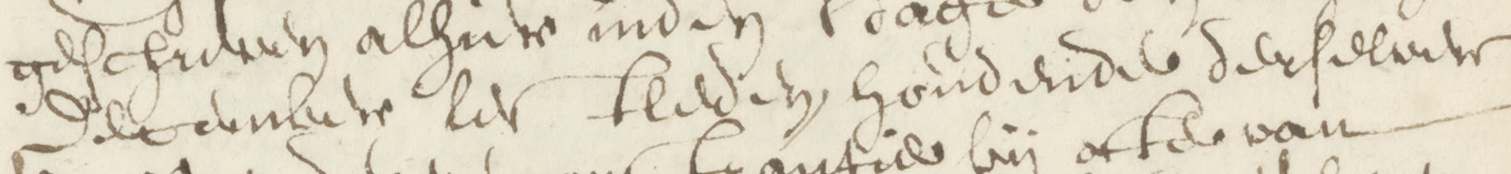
December lestleden, houdende derselver
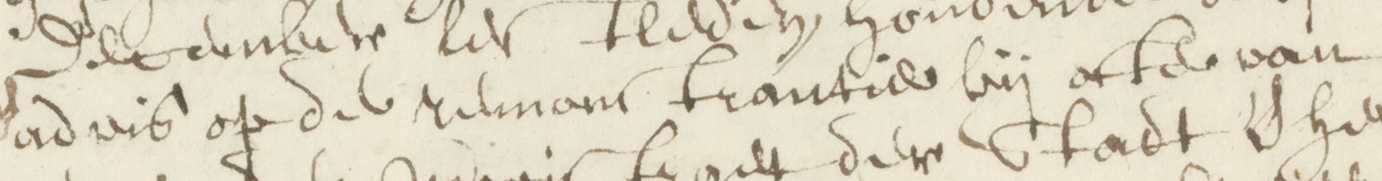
advis op de remonstrantie bij ofte van
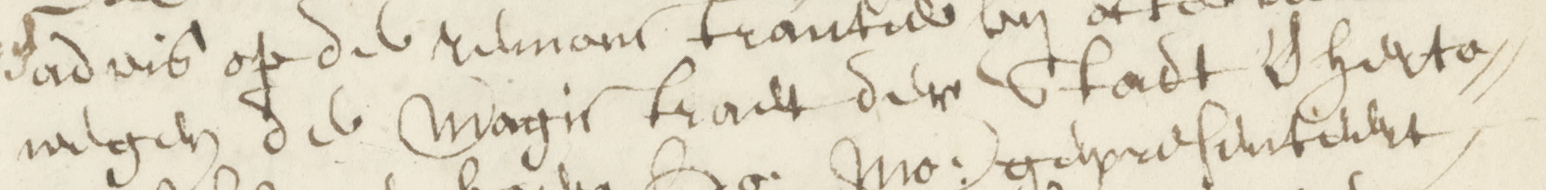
wegen de magistraet der Stadt ‛s herto,,
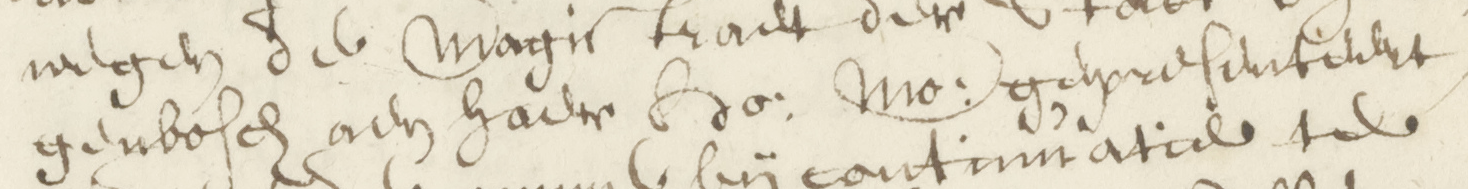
genbosch aen haer Ho:Mo: gepresenteert,
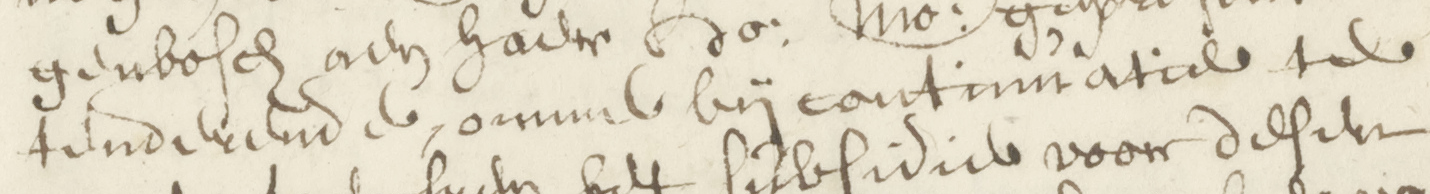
tenderende, omme bij continuatie te
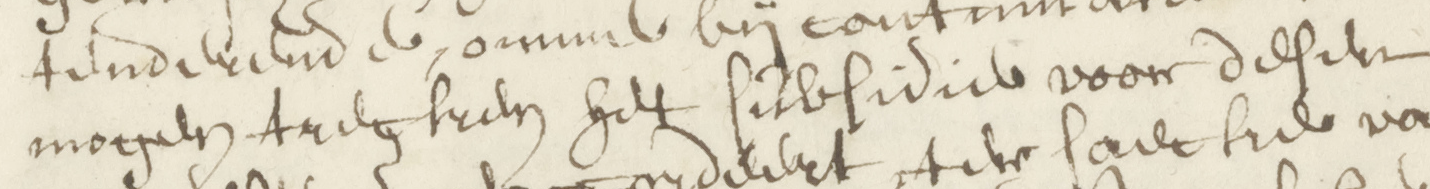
mogen trecken het subsidie voor desen
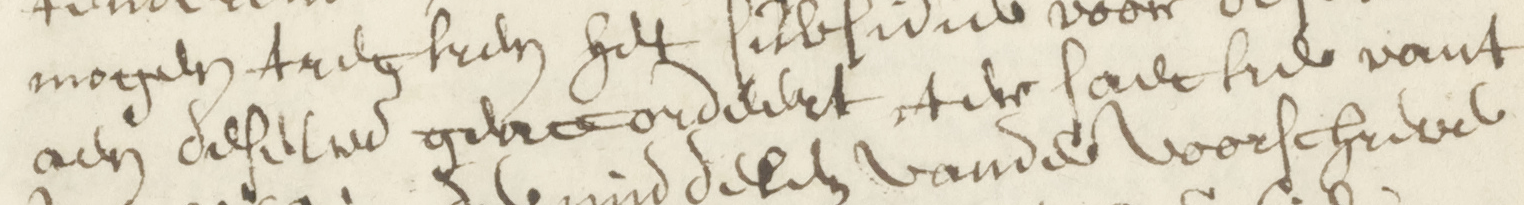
aen deselve geaccordeert, ter saecke vant
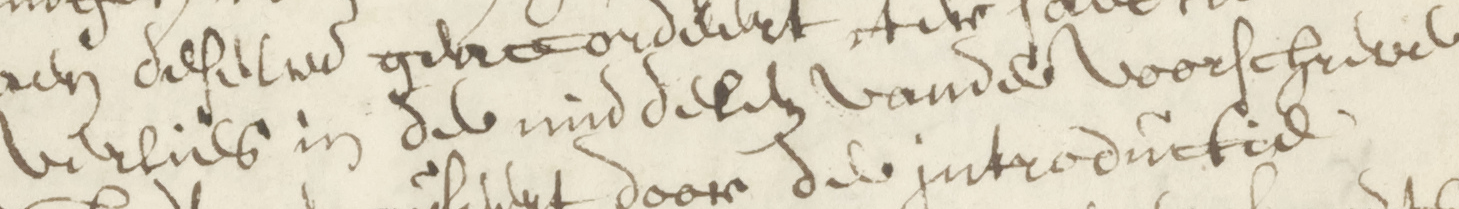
verlies in de middelen vande voorschreve
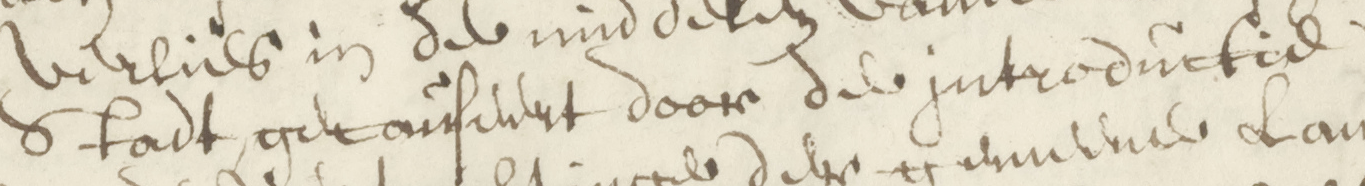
Stadt, gecauseert door de introductie
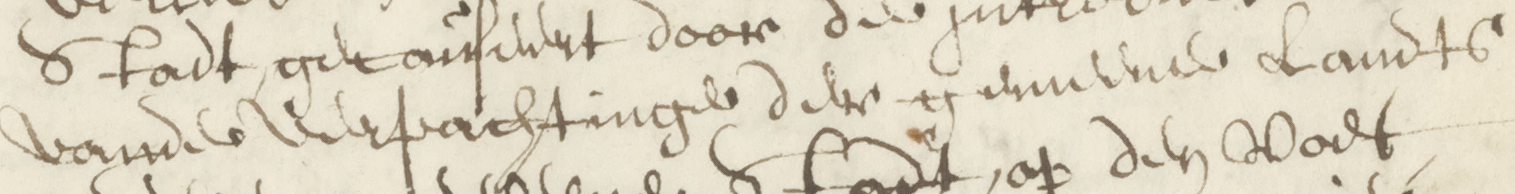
vande Verpachtinge der gemeene Landts
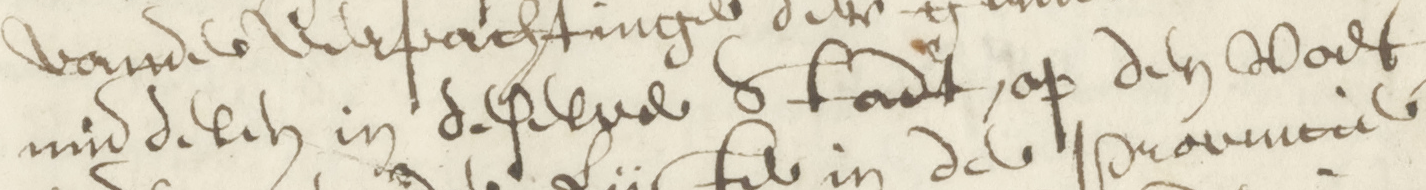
middelen in deselve Stadt, op den Voet
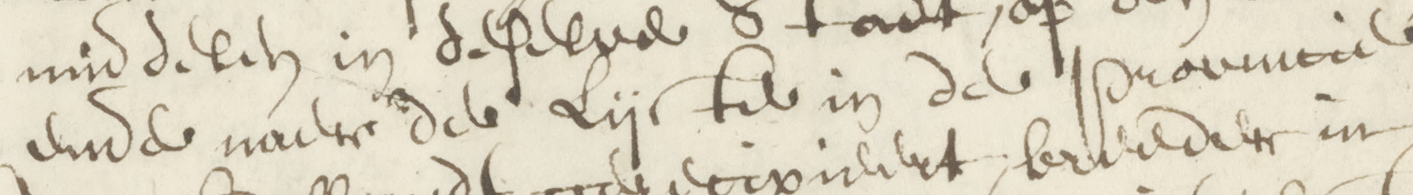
ende naer de Lijste in de Provincie
